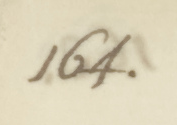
164.
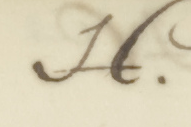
H.
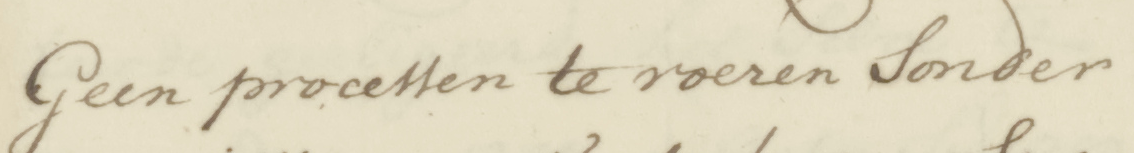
Geen processen te voeren sonder
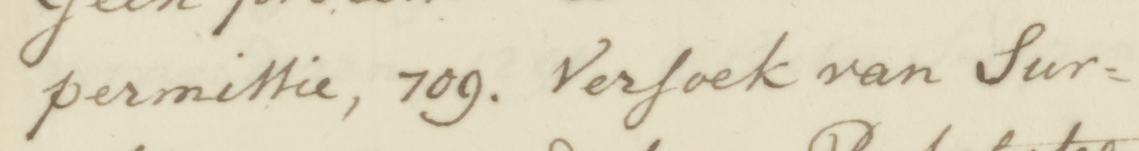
permissie, 709. Versoek van sur„
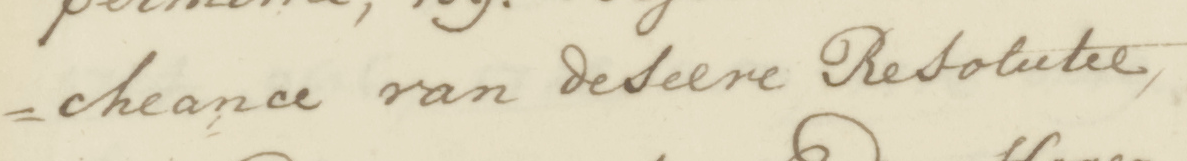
„cheance van deselve Resolutie,
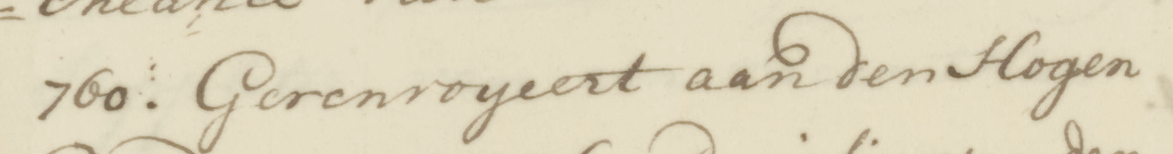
760. Gerenvoyeert aan den Hogen
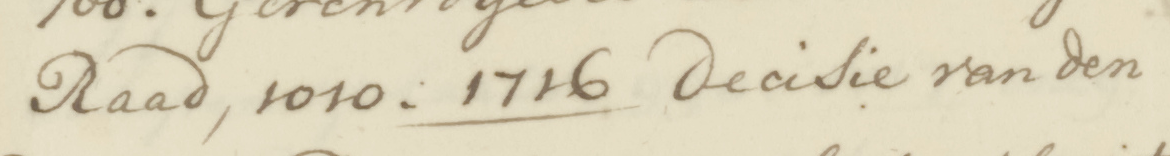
Raad, 1010; 1716 decisie van den
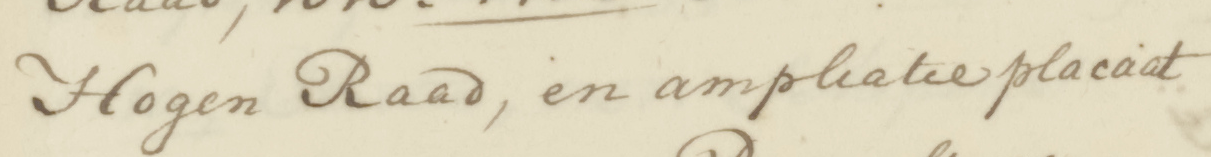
Hogen Raad, en ampliatie placaat
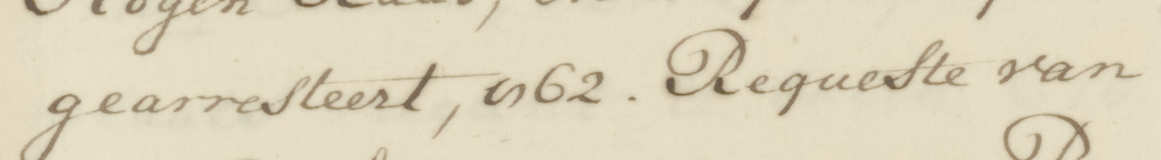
gearresteert, 862. Requeste van
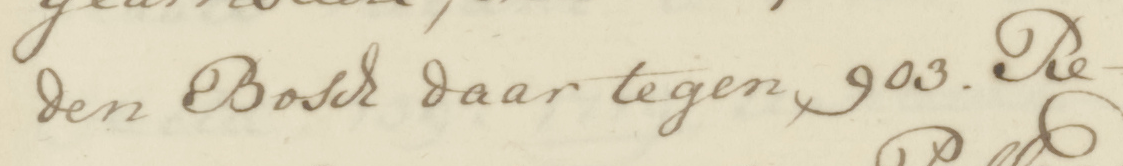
den Bosch daar tegen, 903. Re„
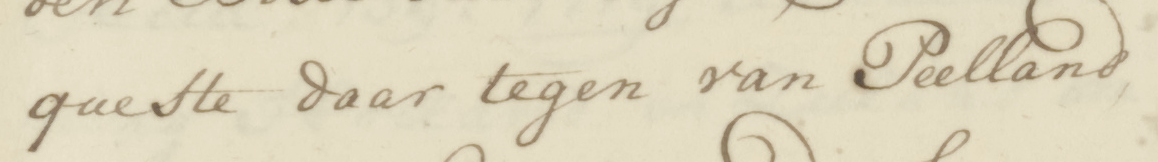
queste daar tegen van Peelland,
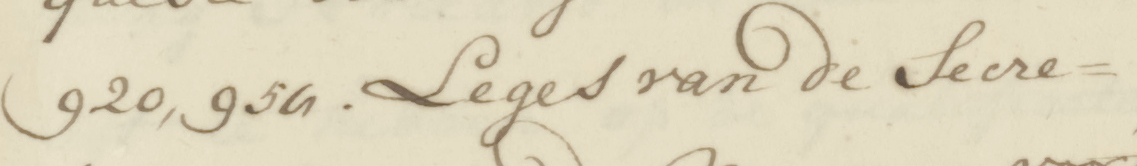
920, 958. Leges van de secre=
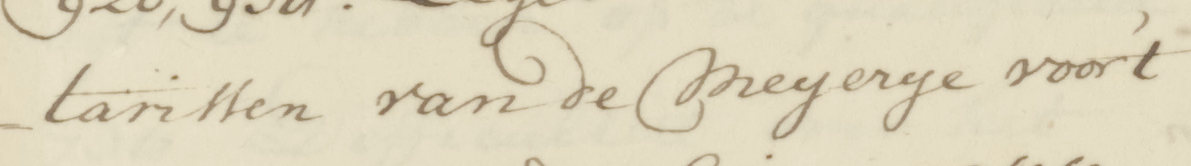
„tarissen van de Meyerye voort
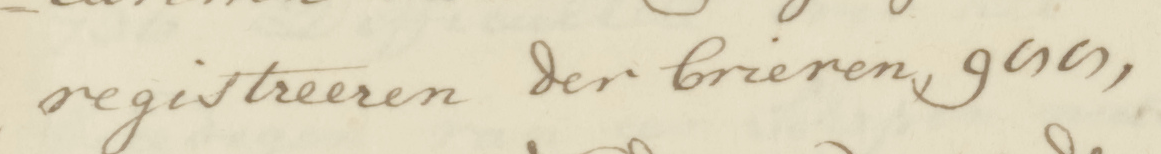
registreeren der brieven, 988,
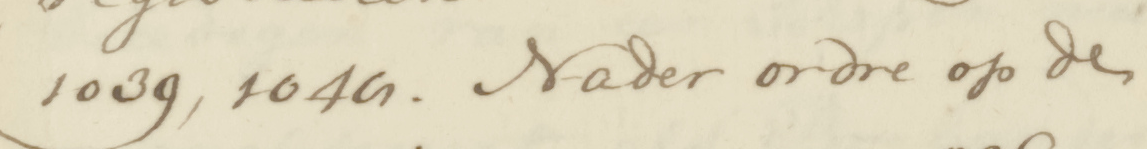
1039, 1048. Nader ordre op de
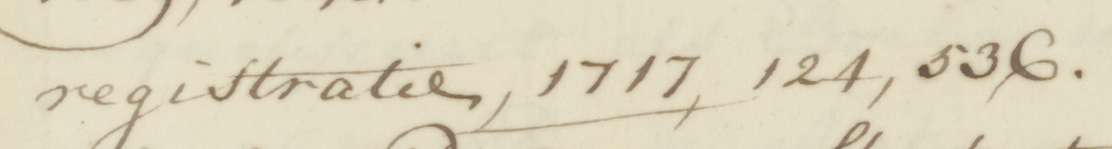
registratie, 1717, 124, 536.
